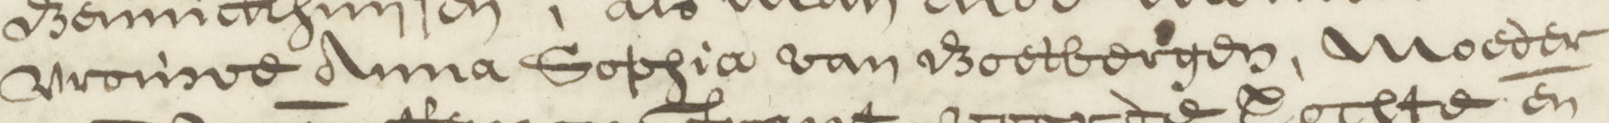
vrouwe Anna Sophia van Boetbergen, Moeder
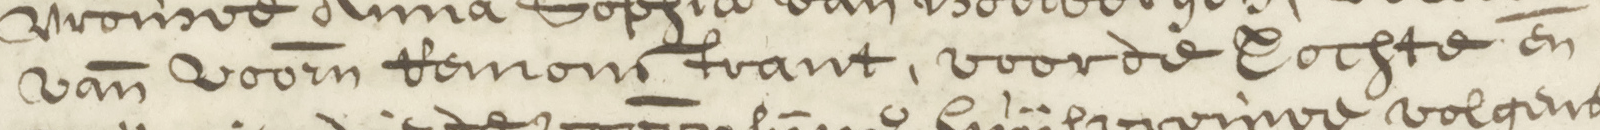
van voorn Remonstrant, voor de Tochte en
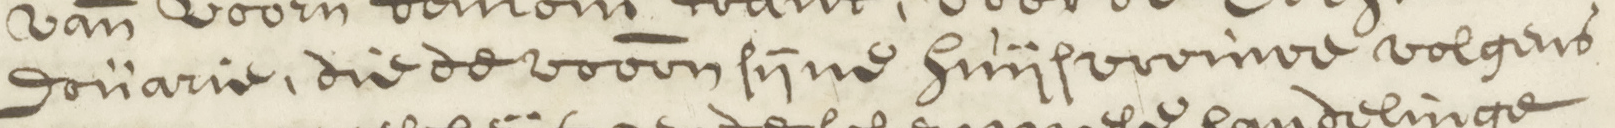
Douarie, die de voorn sijne huijsvrouwe volgens
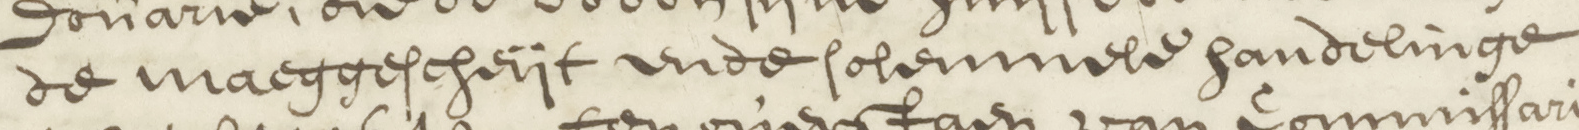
de maeggescheijt ende solemnele handelinge
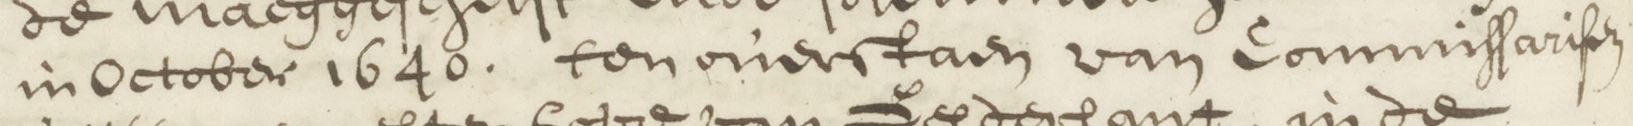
in October 1640. ten ouerstaen van Commissarisen
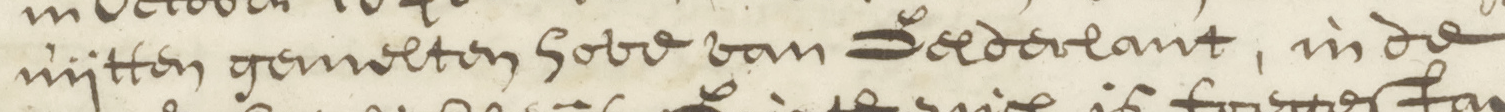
uijtten gemelten hove van Gelderlant, in de
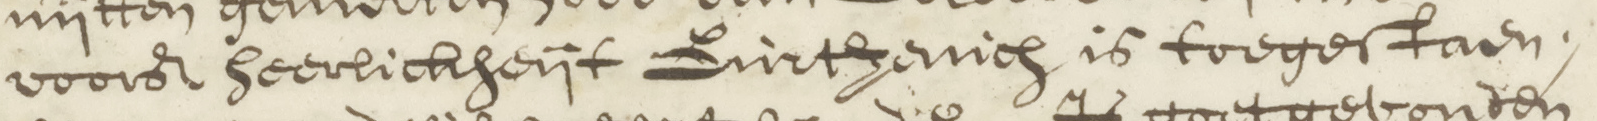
voors. heerlickheijt Gurtzenich is toegestaen.
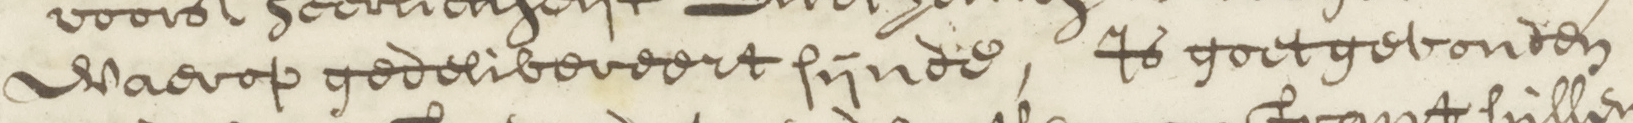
Waerop gedelibereert sijnde, Is goetgevonden
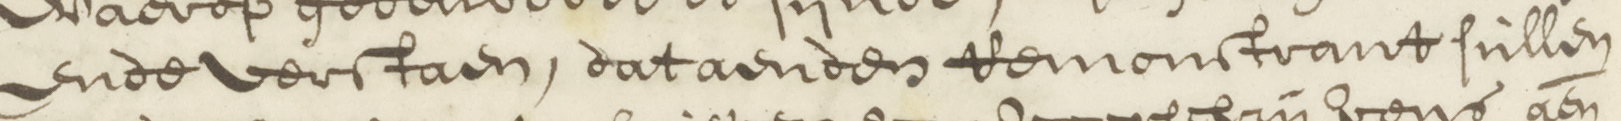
ende verstaen, dat aenden Remonstrant sullen
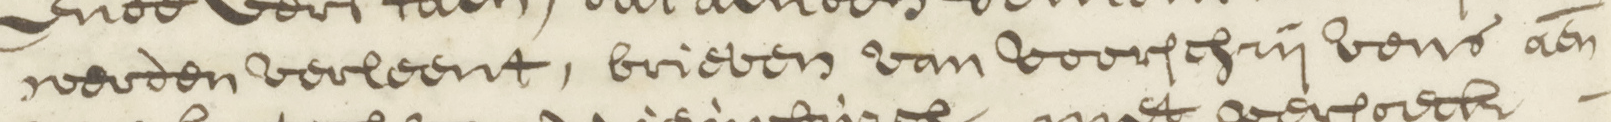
werden verleent, brieven van voorschrijvens aen
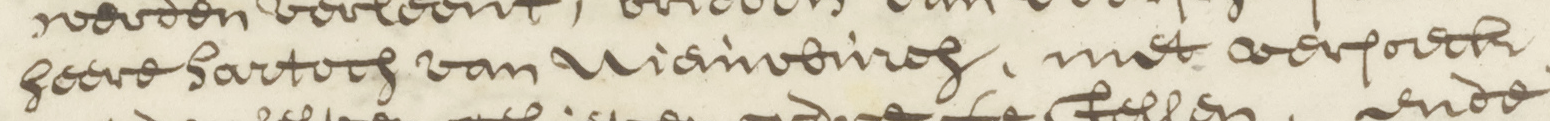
heere hartoch van Nieuwurch, met versoeck
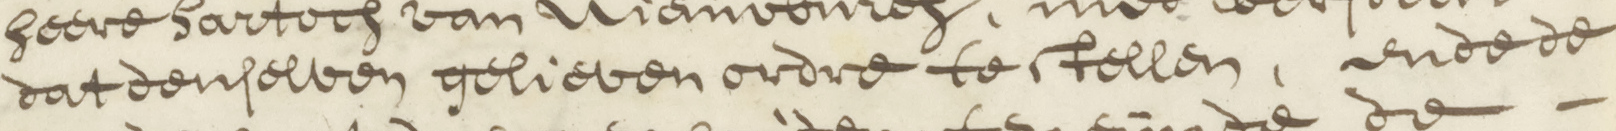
dat denselven gelieven ordre te stellen, ende de
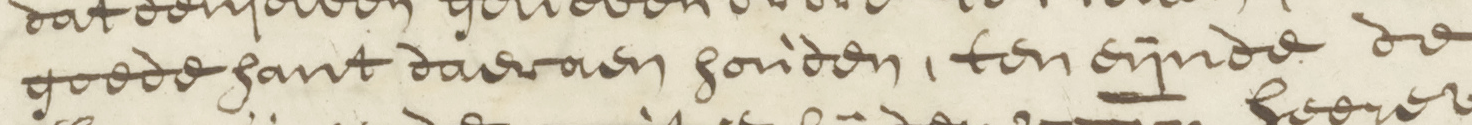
goede hant daeraen houden, ten eijnde de ¬
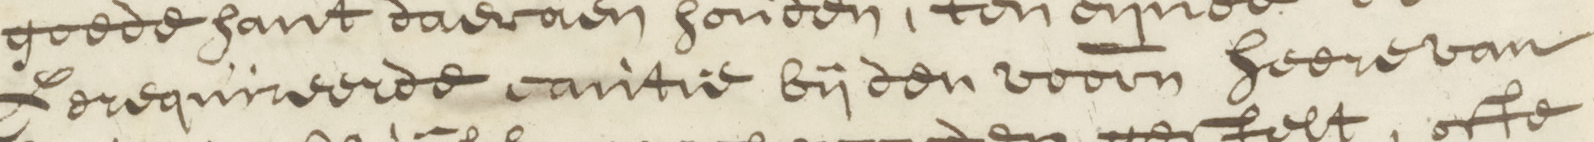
Gerequireerde cautie bij den voorn heere van
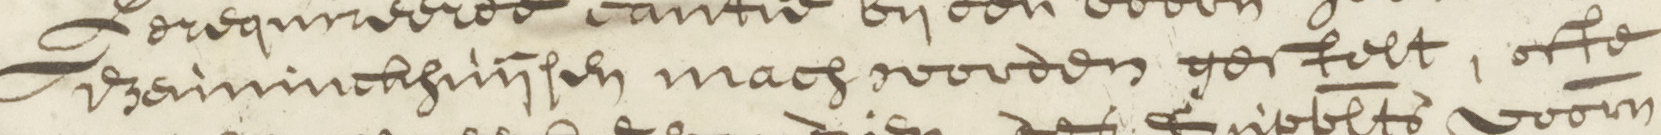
Beuninckhuijsen mach worden gestelt, ofte
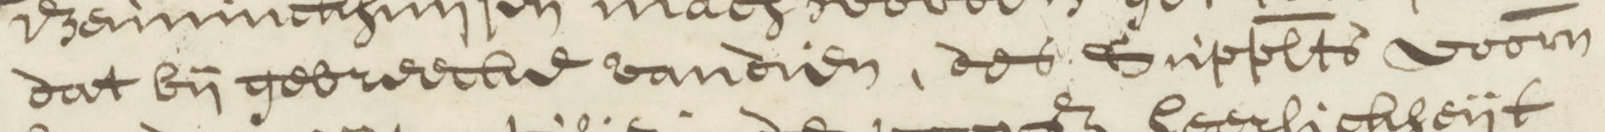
dat bij gebreecke vandien, des Supplts voorn
